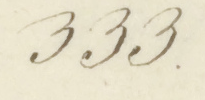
333
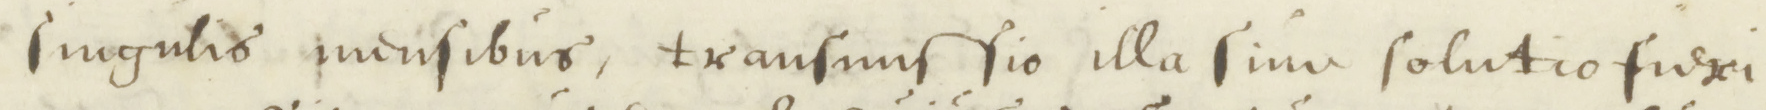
singulis mensibus, transmissio illa siue solutio fieri
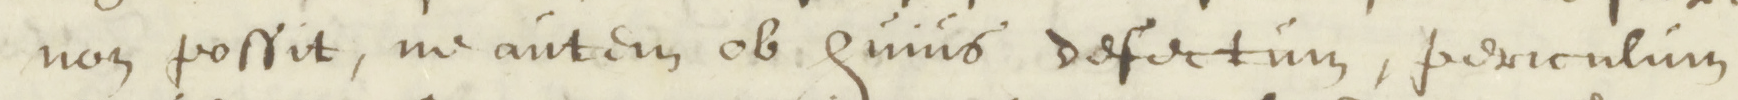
non possit, ne autem ob huius defectum, periculum
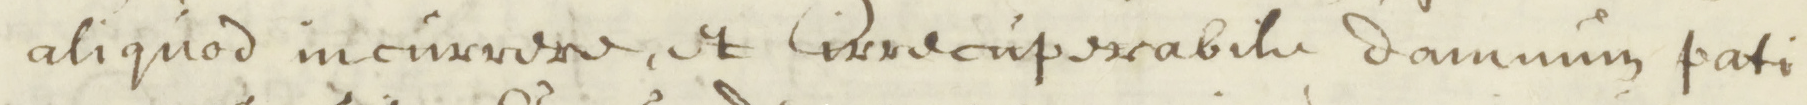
aliquod incurrere, et irrecuperabile damnum pati
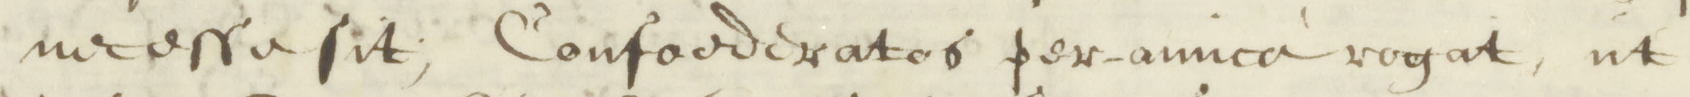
necesse sit; Confoederatos per amica rogat, ut
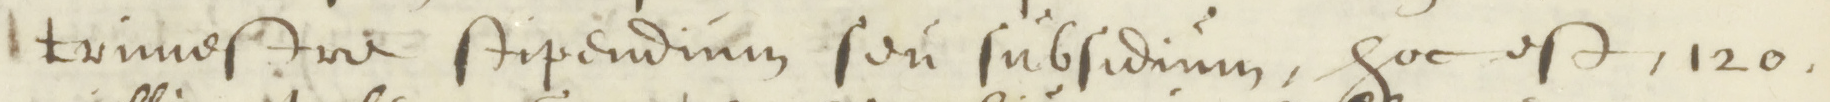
trimestre stipendium seu subsidium, hoc est, 120
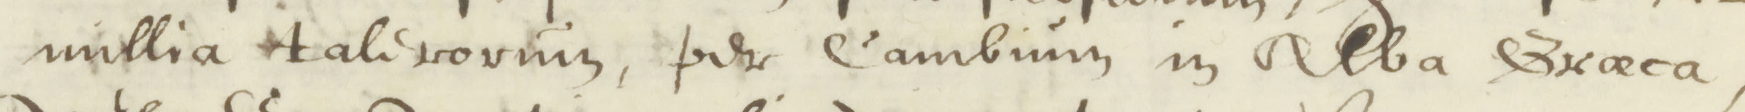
millia talerorum, per Cambium in Alba Gracæ,
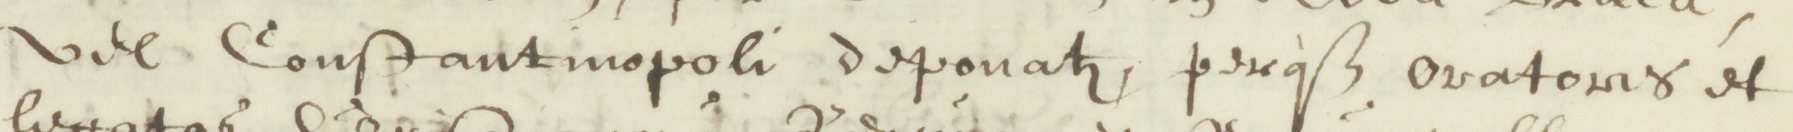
vel Constantinopoli deponat; perq oratoris et
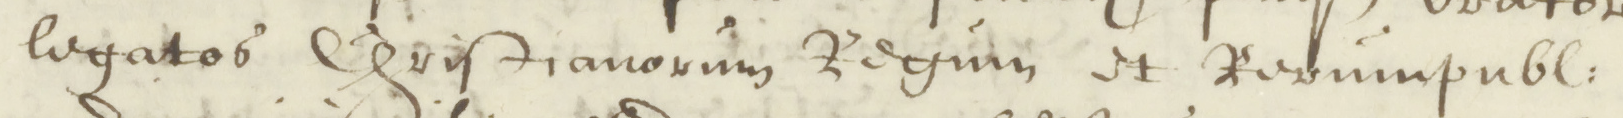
legatos Christianorum Regum et Rerumpubl:
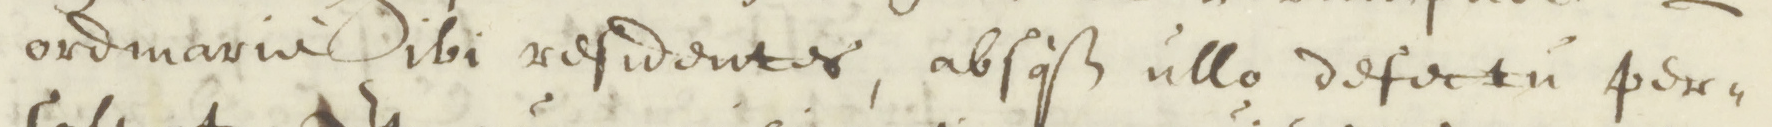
ordinarie ibi residentes absq ullo defectu per„
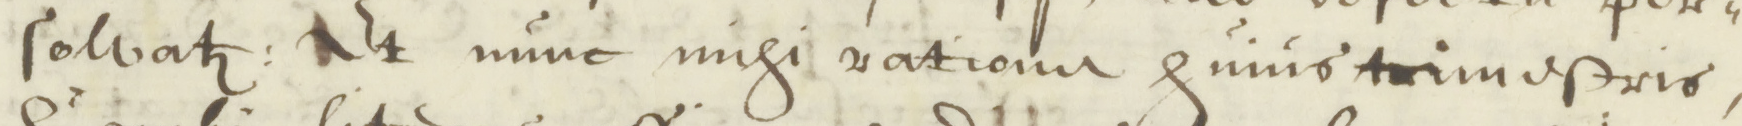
solvat: Et nunc mihi ratione huius trimestris,
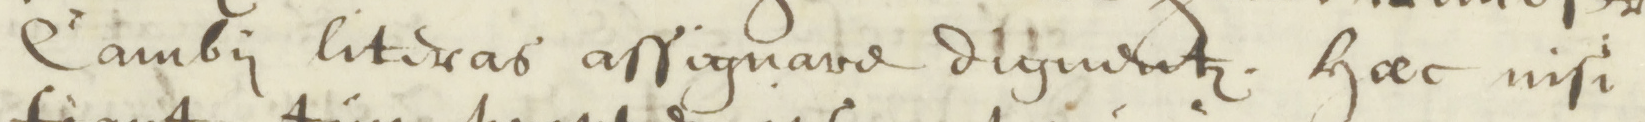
Cambii literas assignare dignent. Hæc nisi
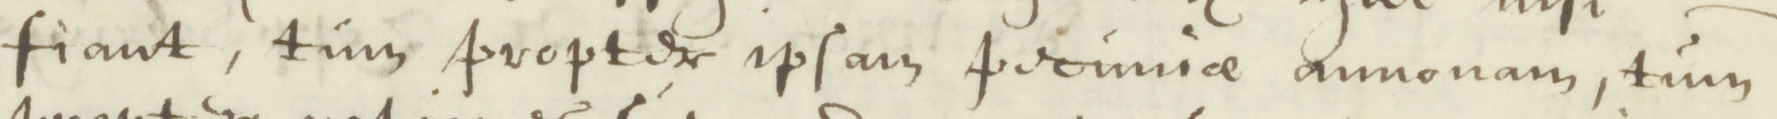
fiant, tum propter ipsam pecuniæ annonam, tum
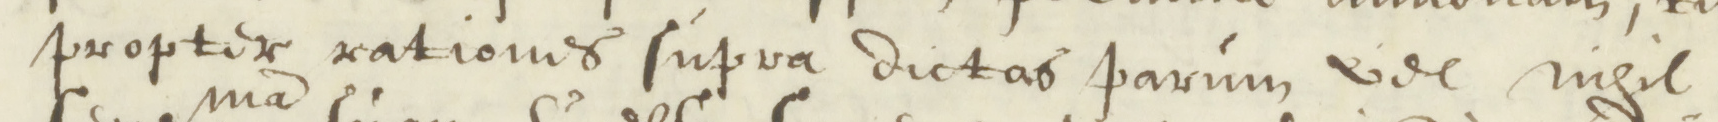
propter rationes supra dictas parum vel nihil
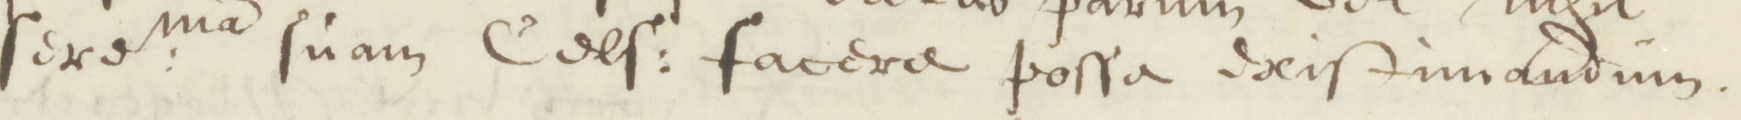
serema: suam Cels. facere posse existimandum.
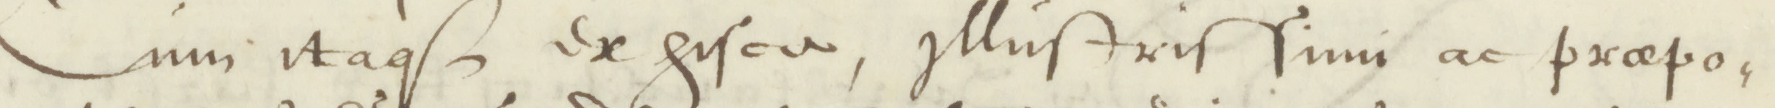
Cum itaq ex hisce, illustrissimi ac præpo„
